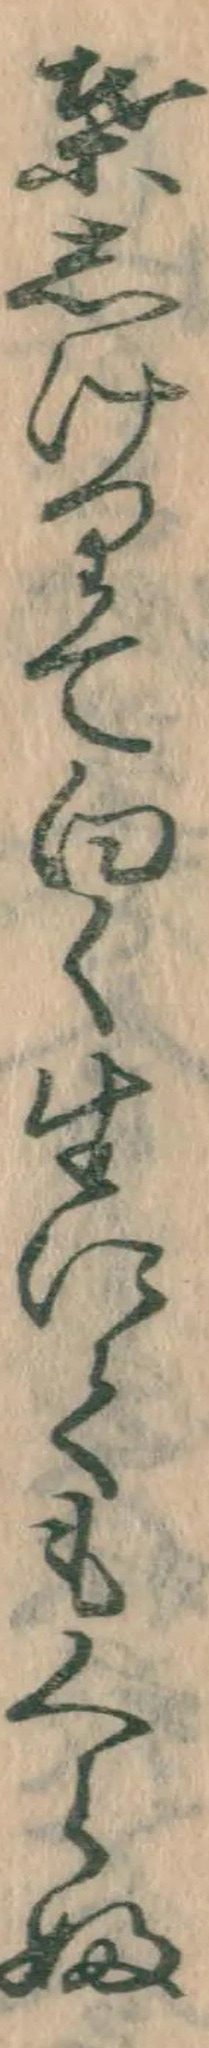葉しけりて白く生にてもくらふ

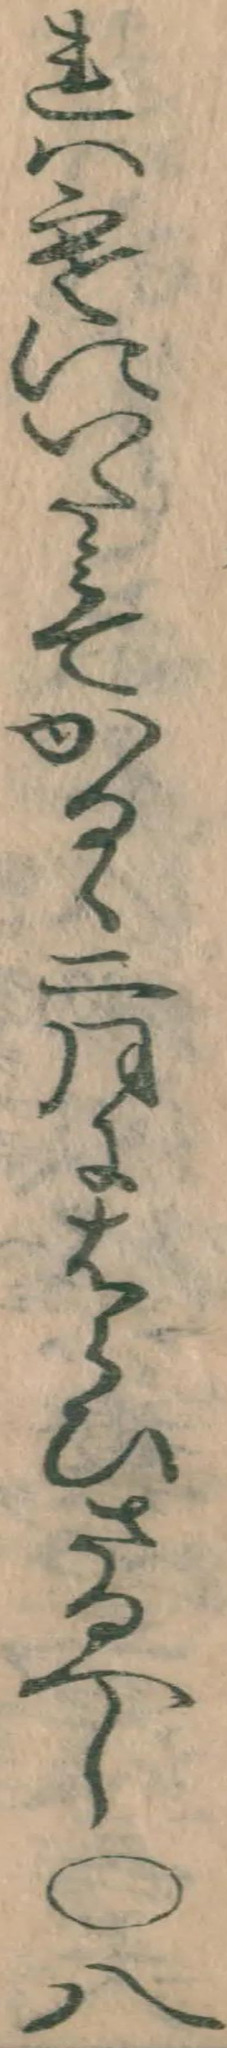れは寒にいたみてかるゝ二月にはらひさるへし〇八
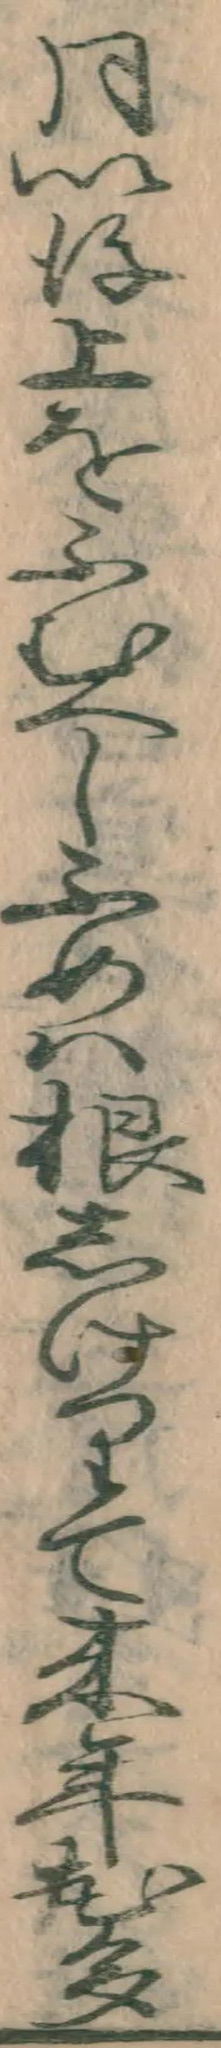月以後は上をふむへしふめは根しけりて来年花多
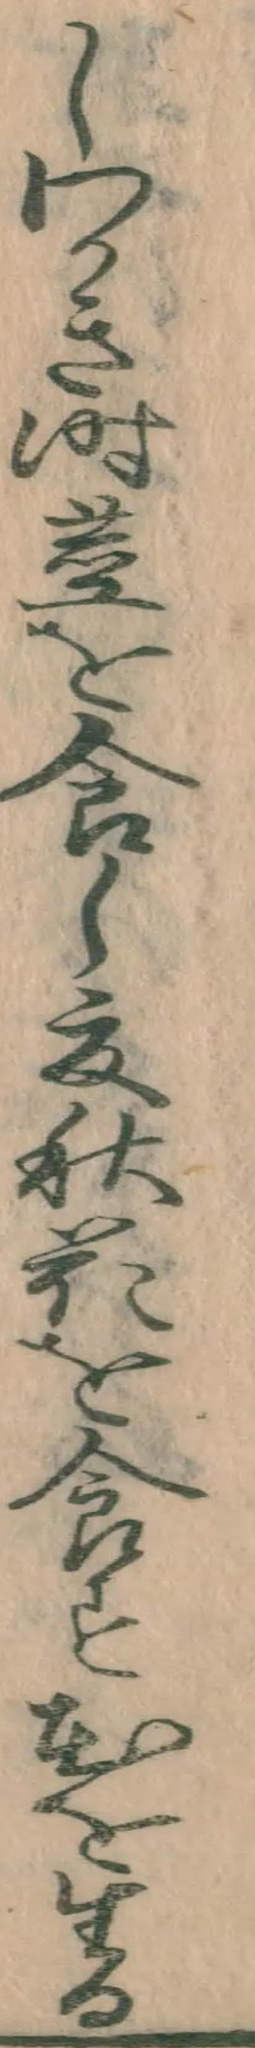しわかき時茎を食し夏秋花を食す花を生る
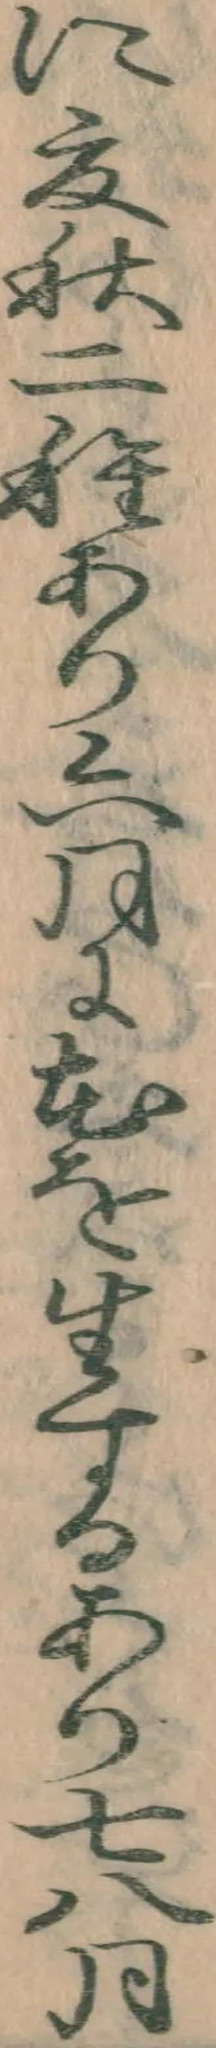に夏秋二種あり六月に花を生するあり七八月
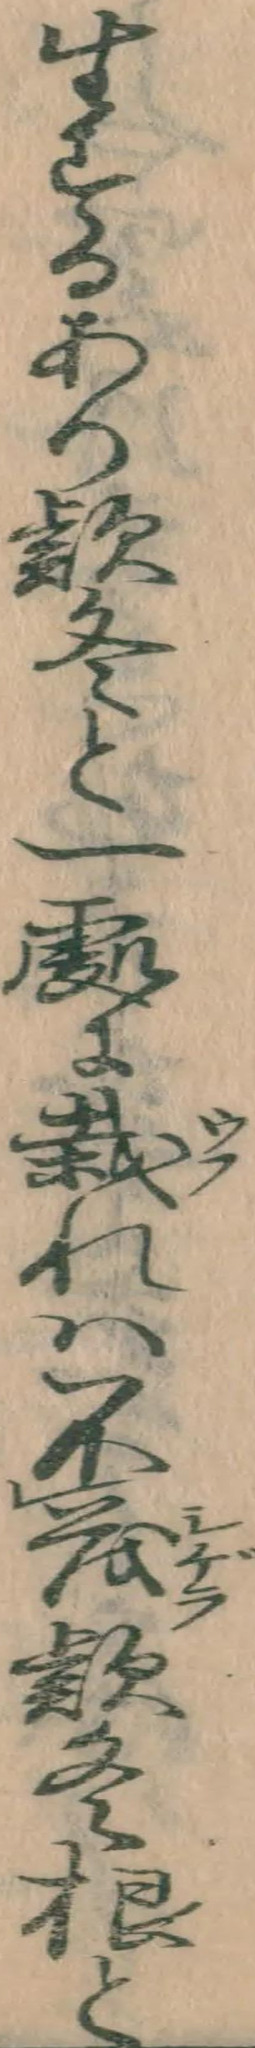生するあり疑冬と一処に栽れは不茂疑冬根と
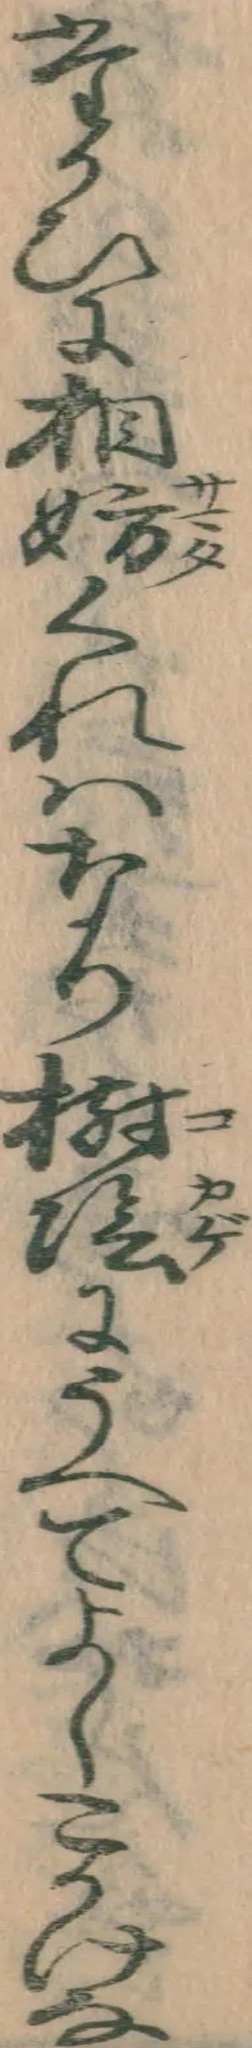たかひに相妨くれはなり樹陰にうへてよしこかけな
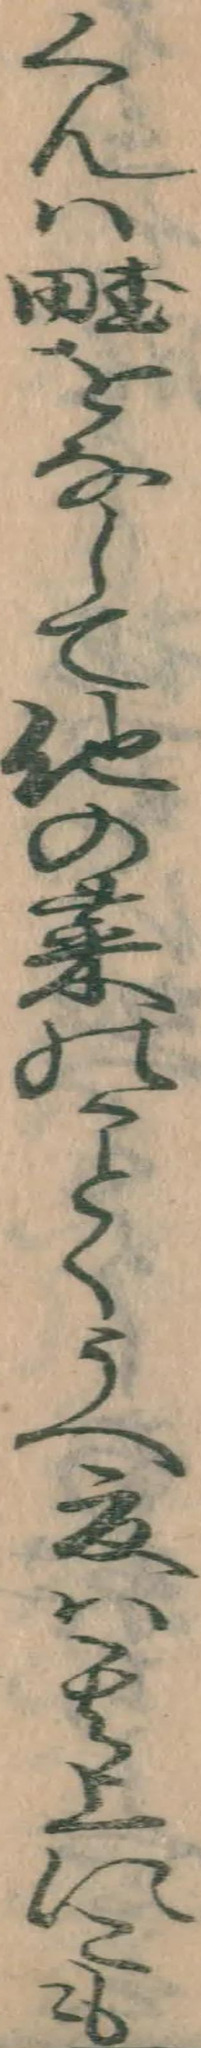くんは畦をなして他の菜のことくうへ夏は其上にこも
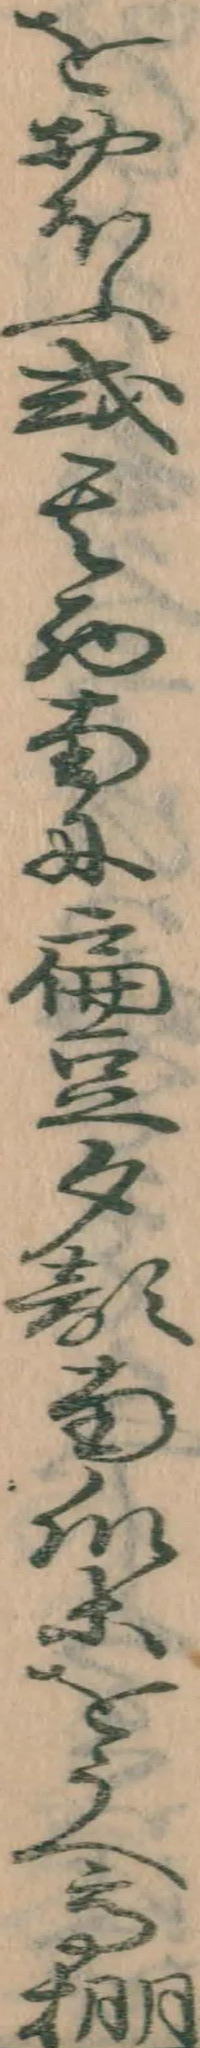をいおほふ或其西南に扁豆夕顔南瓜等をうへ高棚
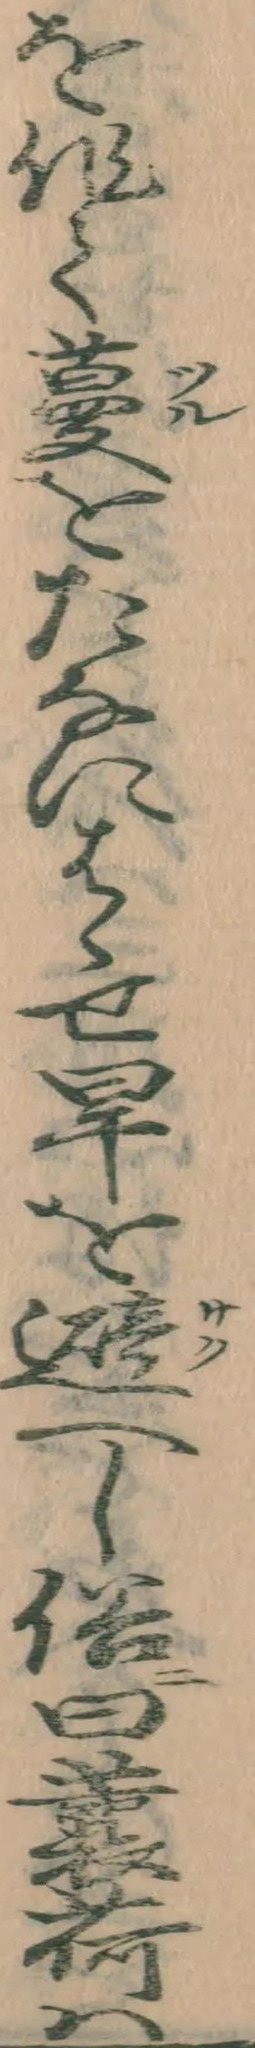を作て蔓をたなにはゝせ旱を避へし俗曰蘘荷は
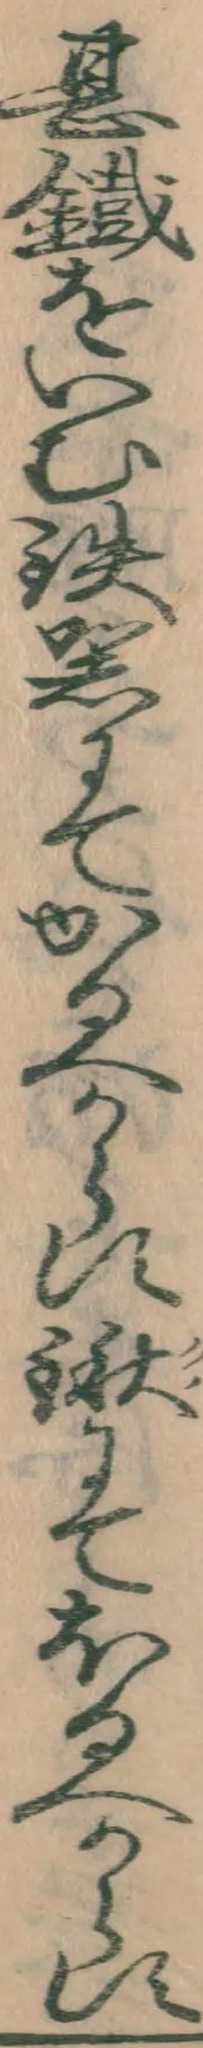甚鐡をいむ鉄器にてかるへからす鍬にてほるへからす
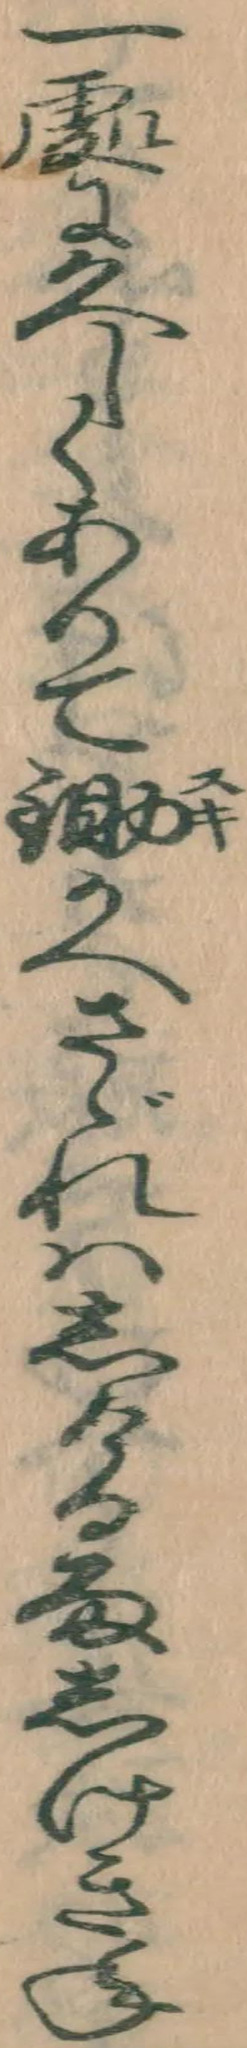一処に久しくありて鋤かへさゞれはしける雨しけき年
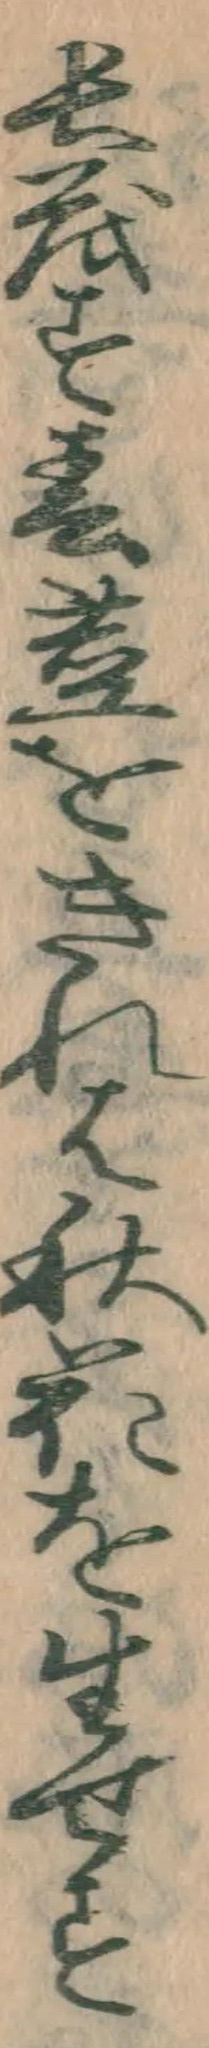長茂す春茎をきれは秋花を生せす
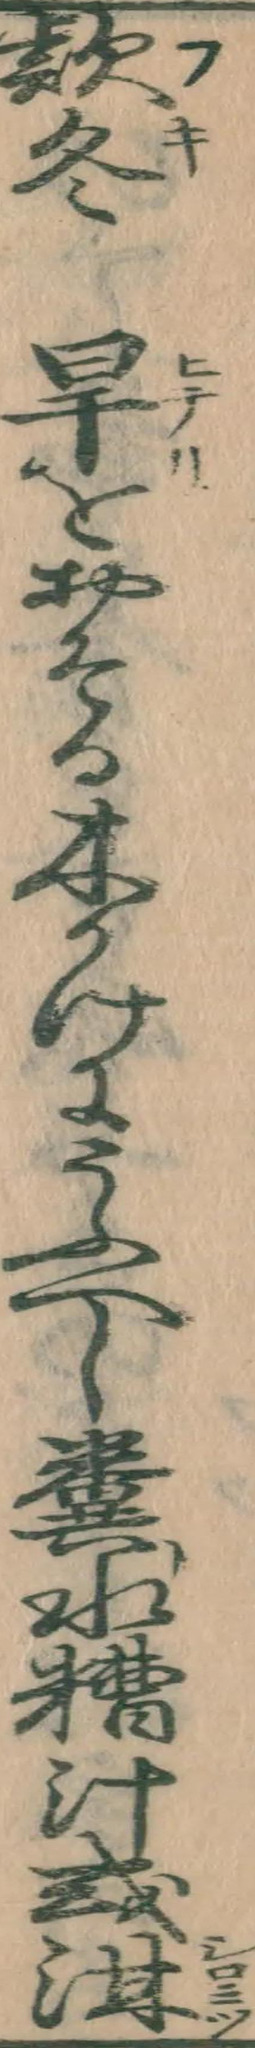疑冬旱をおそる木かけにうふへし糞水糟汁或泔
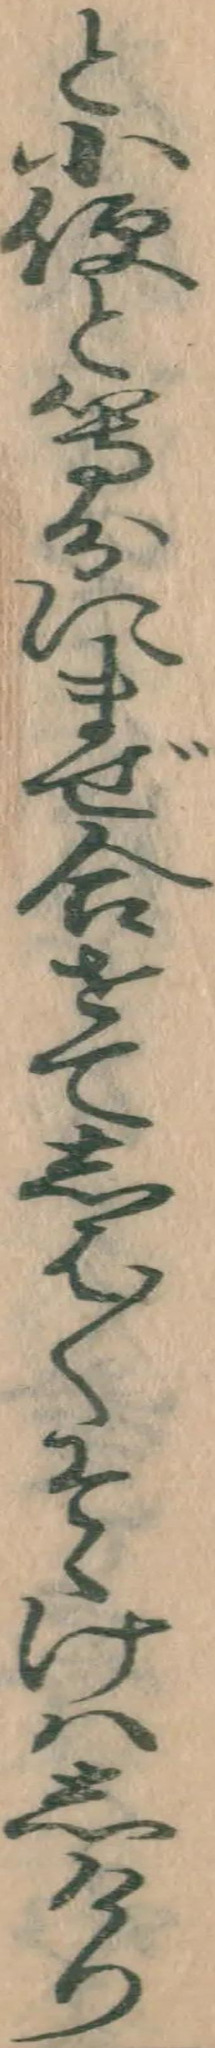と小便と当分にまぜ合せてしは〳〵そゝけはしけり
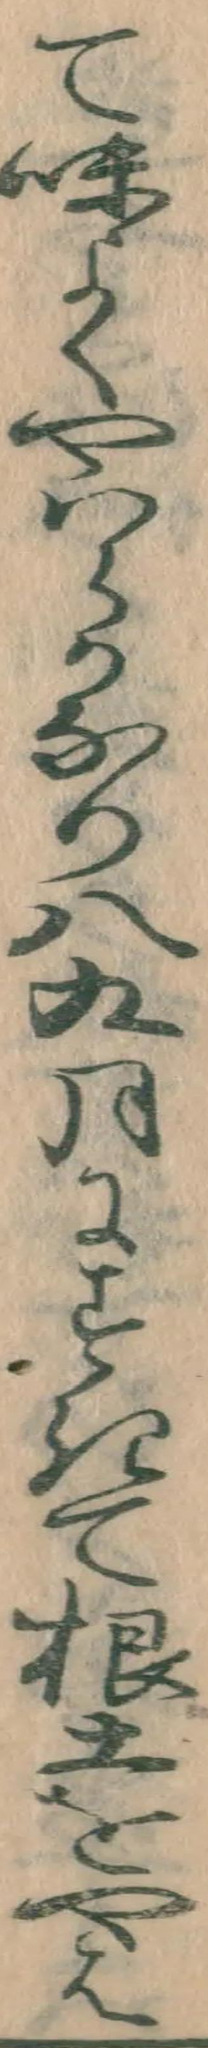て味よくやはらかなり八九月にすきて根土をやは
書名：菜譜 3巻
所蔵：国立国会図書館 National Diet Library, JAPAN
